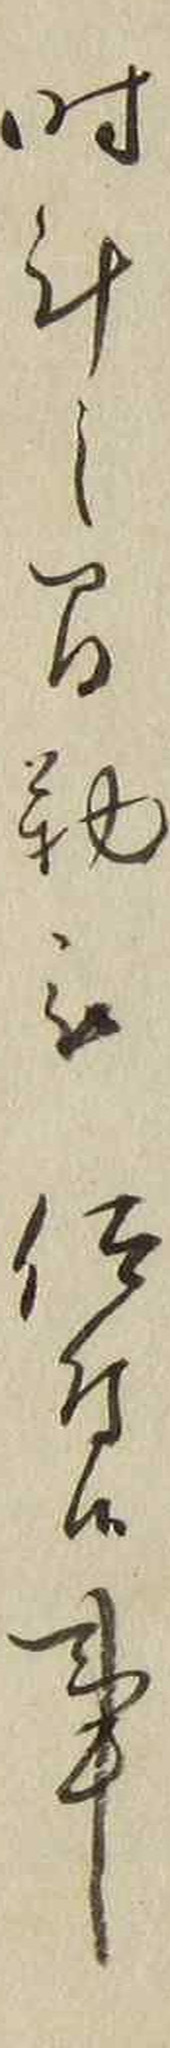時計之間勤被仰付候事

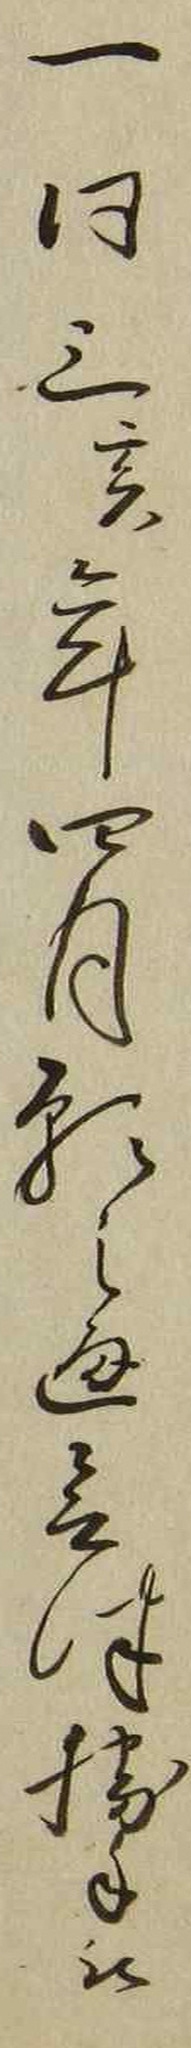一同三亥年四月願之通会津勝手被
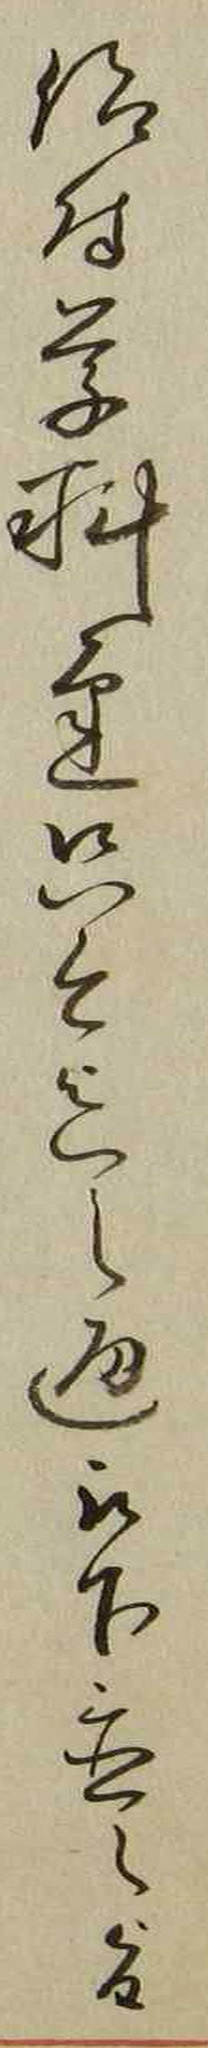仰付学料金只今迄之通被下置之旨
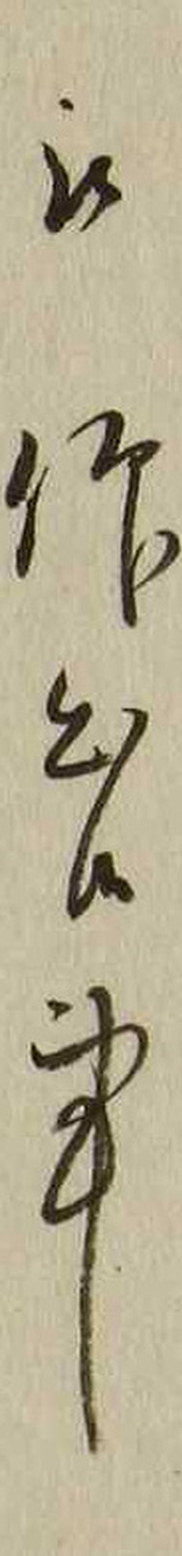被仰出候事
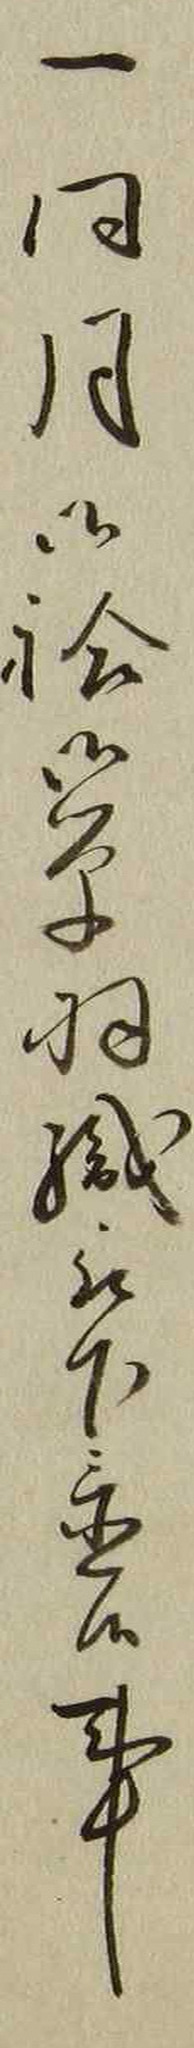一同月御袷御単羽織被下置候事
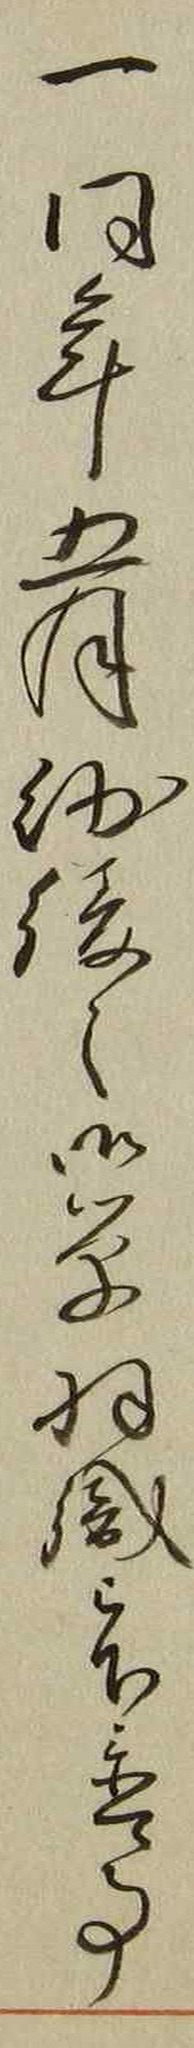一同年五月紗綾之御単羽織被下置候事
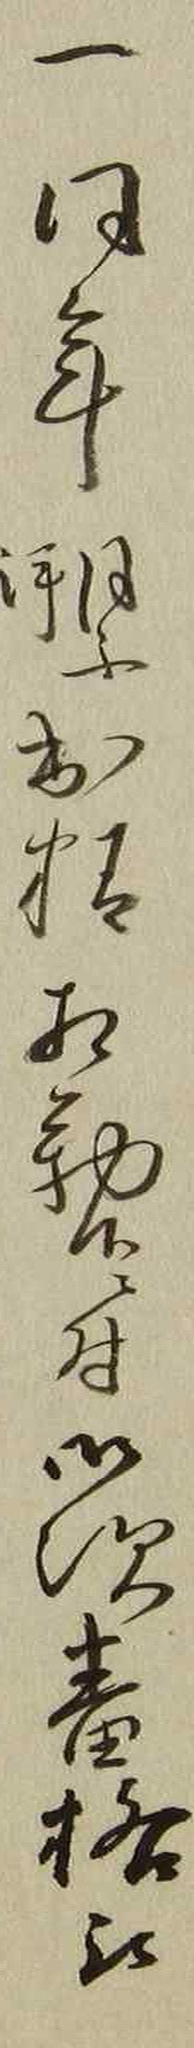一同年月不詳出精相勤候に付御次番格被
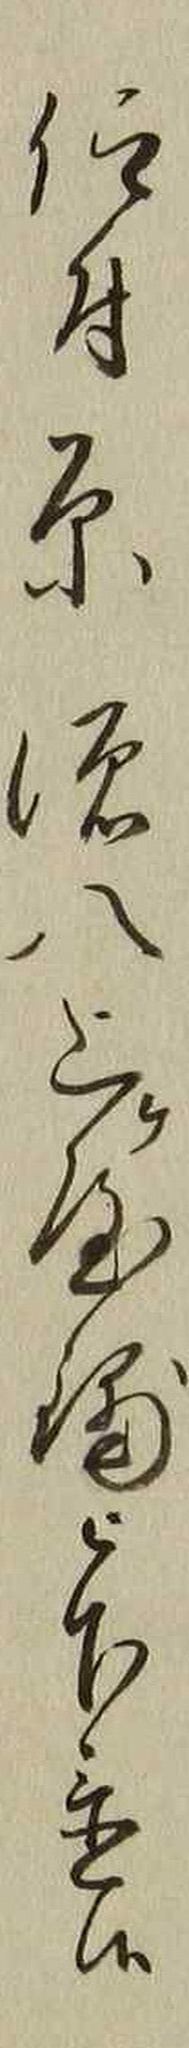仰付原源八上ケ屋鋪被下置候
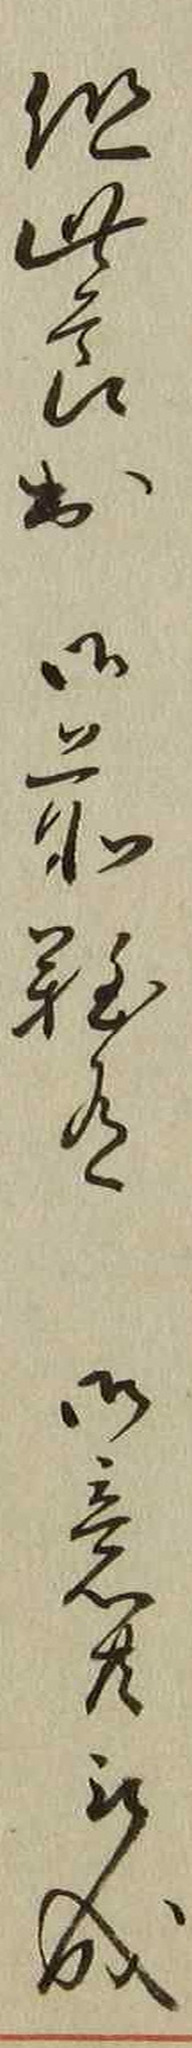但此節出御前難有御意共被成
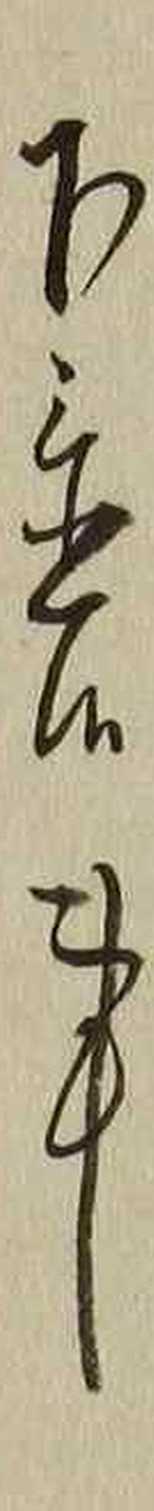下置候事
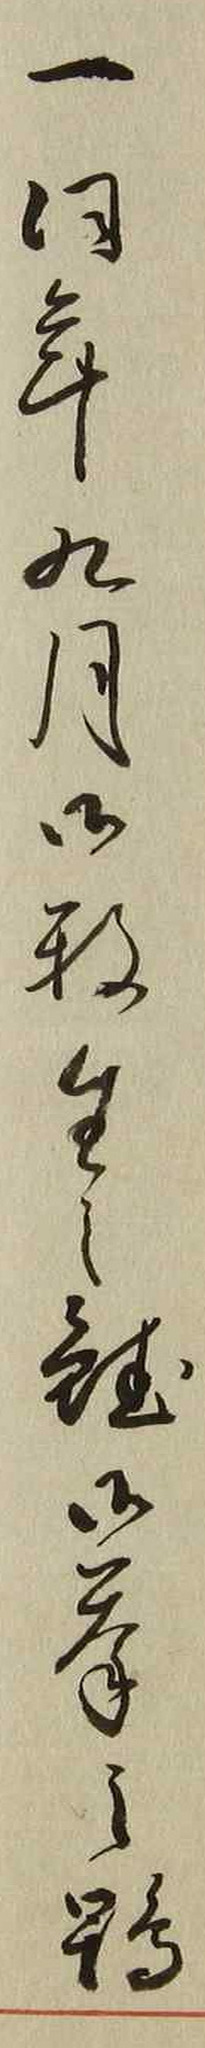一同年九月御殺生之鮭御挙之鵯
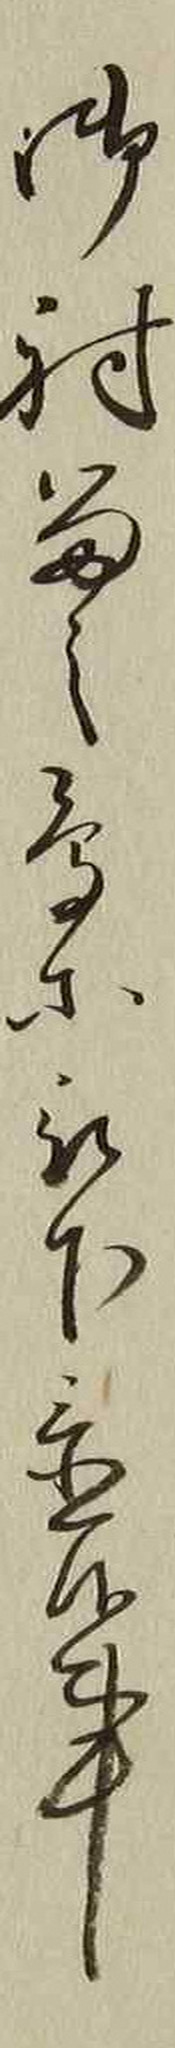御射留之鳥等被下置候事
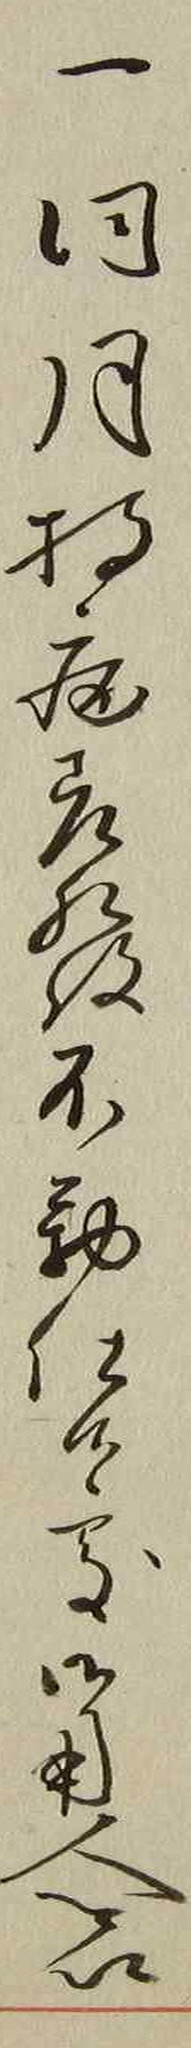一同月持病差発不勤仕候処御用人を以
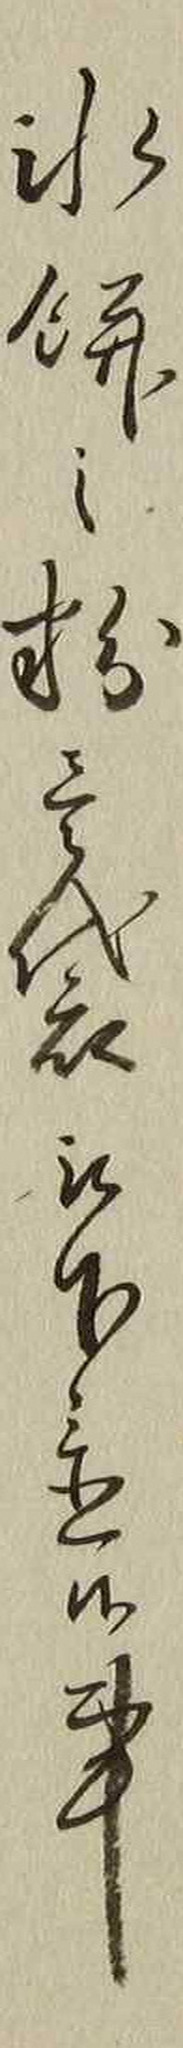氷餅之粉壱袋被下置候事
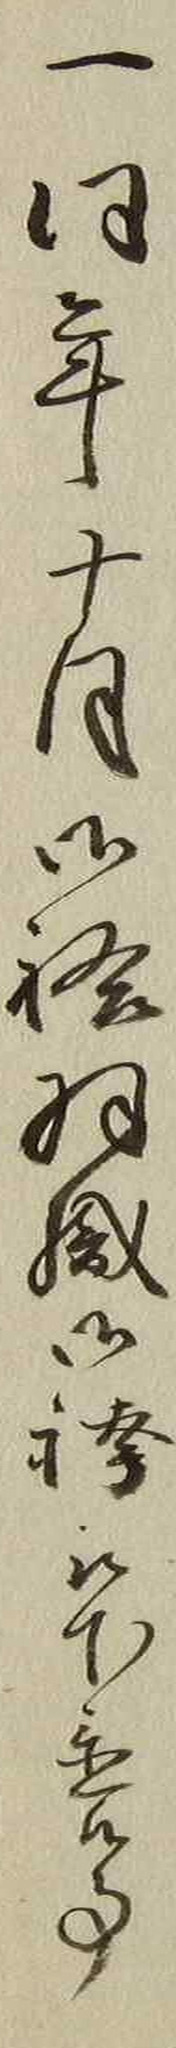一同年十月御袷羽織御袴被下置候事
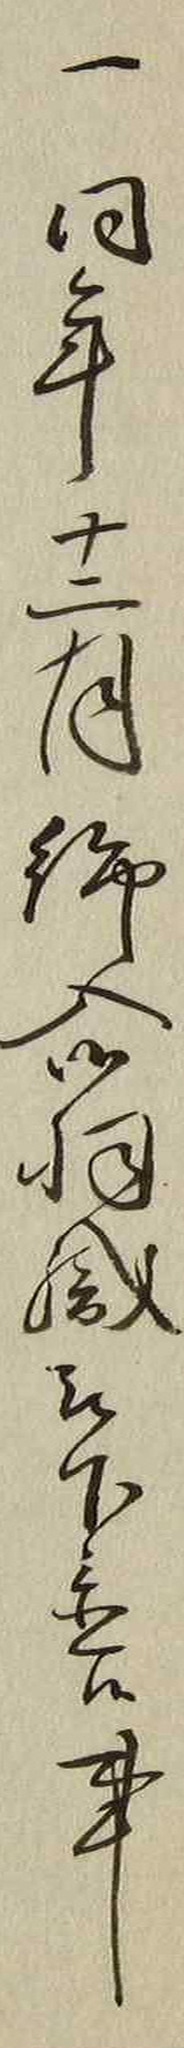一同年十二月綿入御羽織被下置候事
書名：諸士系譜　巻之3　い之部3
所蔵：会津若松市立会津図書館
